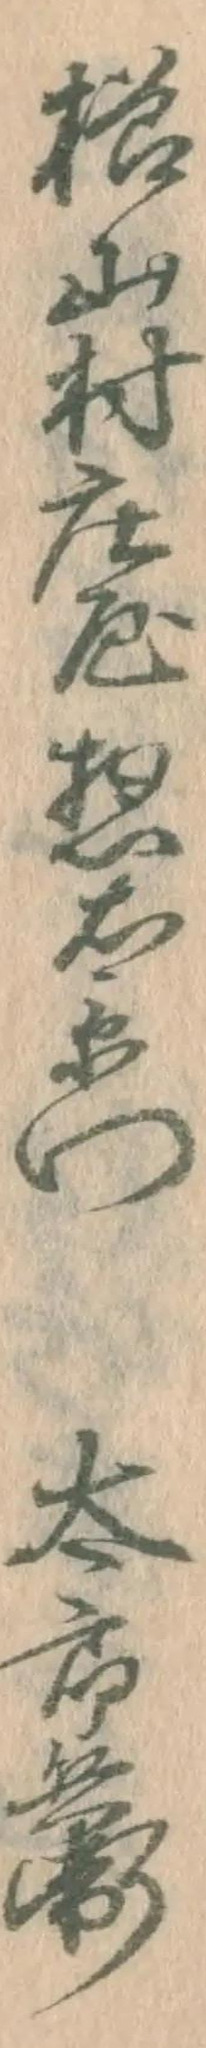櫛山村庄屋惣右衛門太郎兵衛
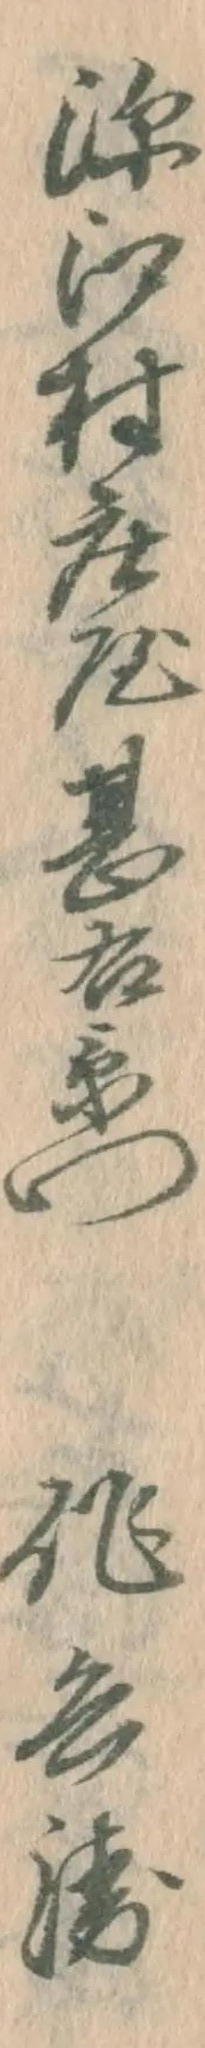深江村庄屋甚右衛門作兵衛
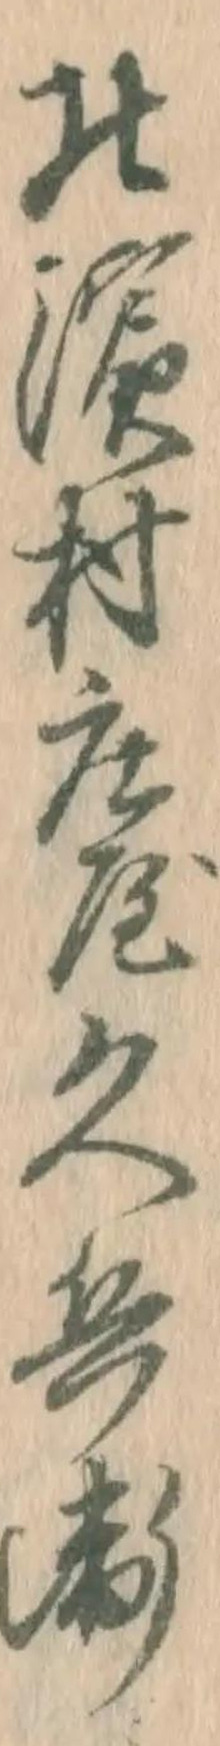北浜村庄屋久兵衛
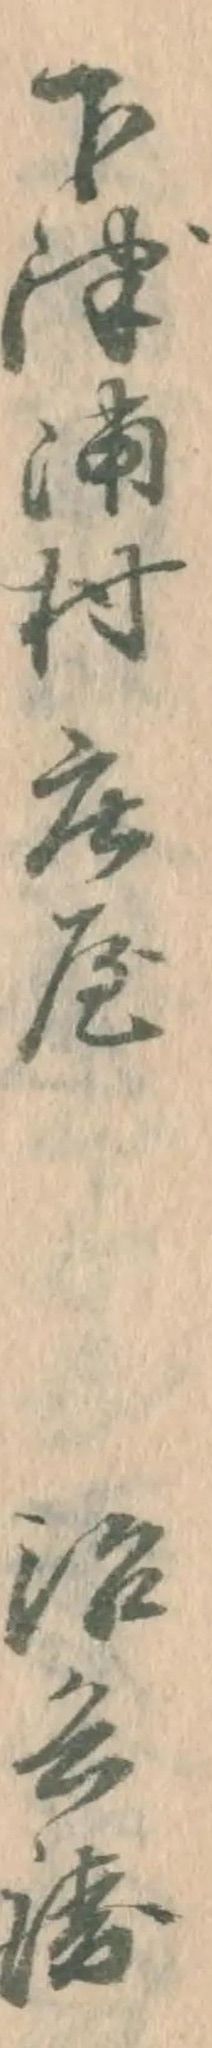下津浦村庄屋治兵衛

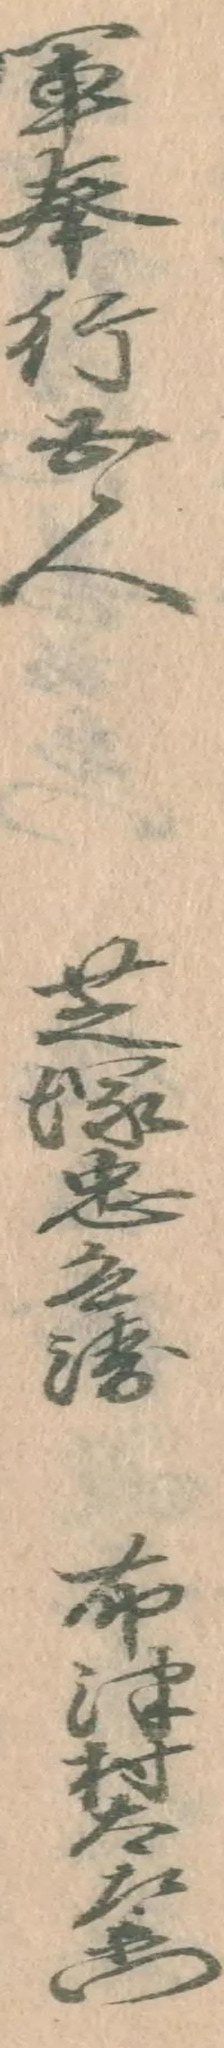軍奉行五人芝塚忠兵衛布津村太左衛門
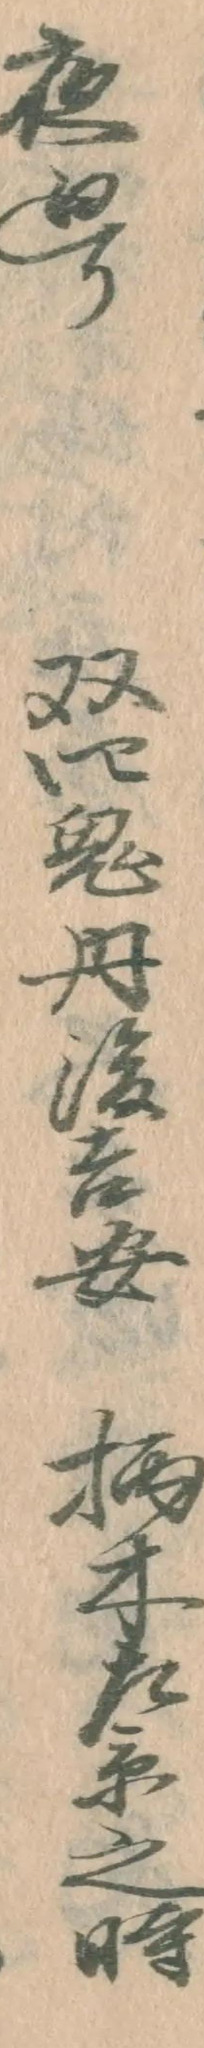夜廻り双四鬼丹後吉安栖本左衛之時
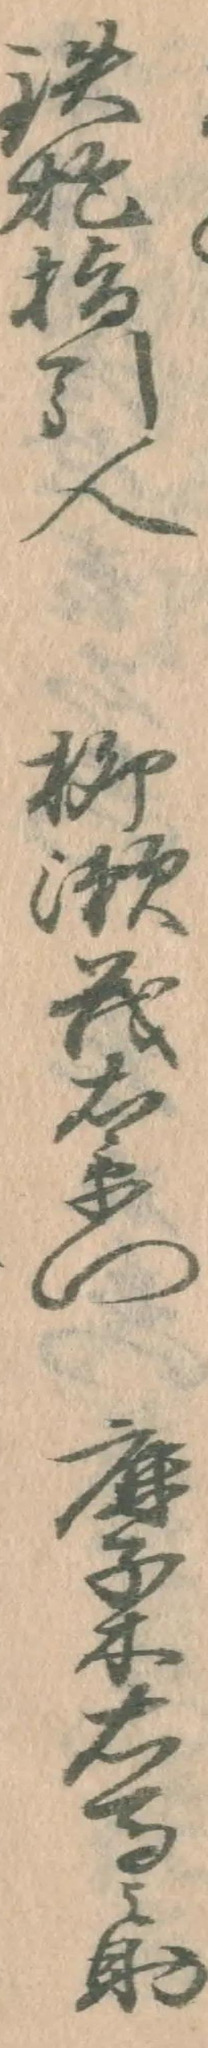鉄炮指引人柳瀬茂右衛門廉子木右馬之助
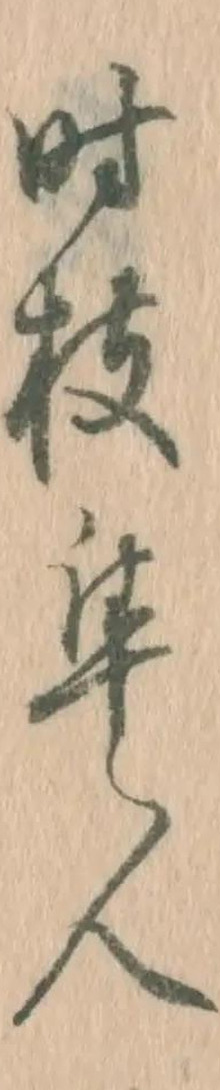時枝隼人
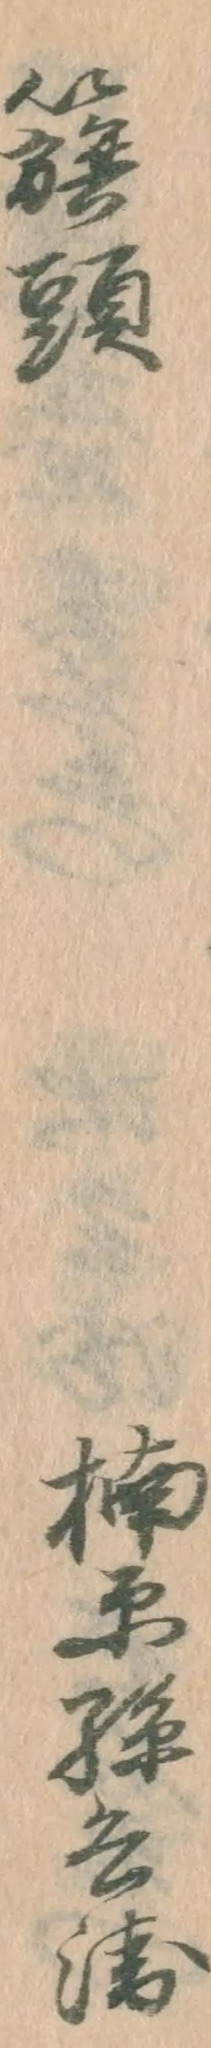籏頭楠原孫兵衛
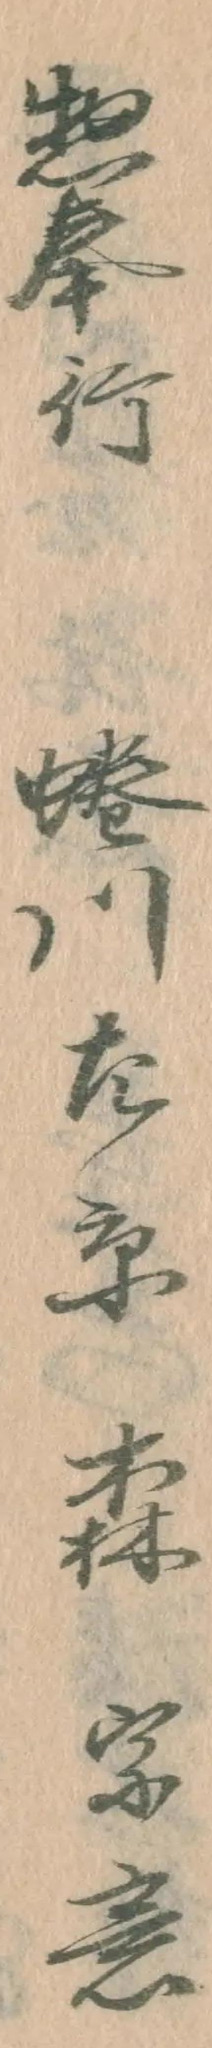惣奉行蜷川左京森宗意
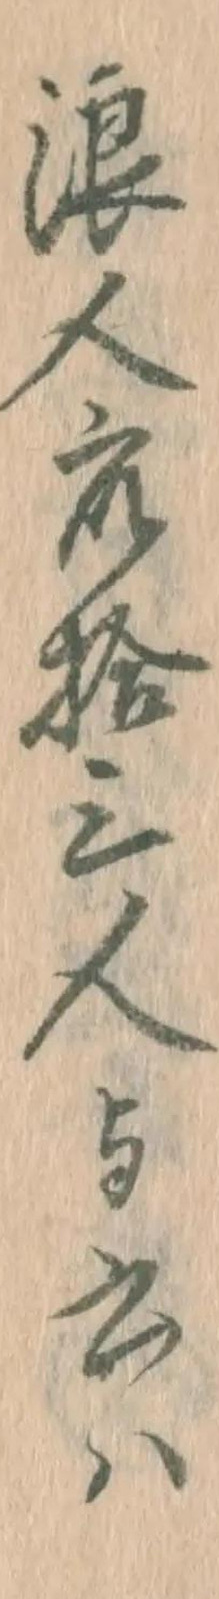浪人衆拾三人与云は
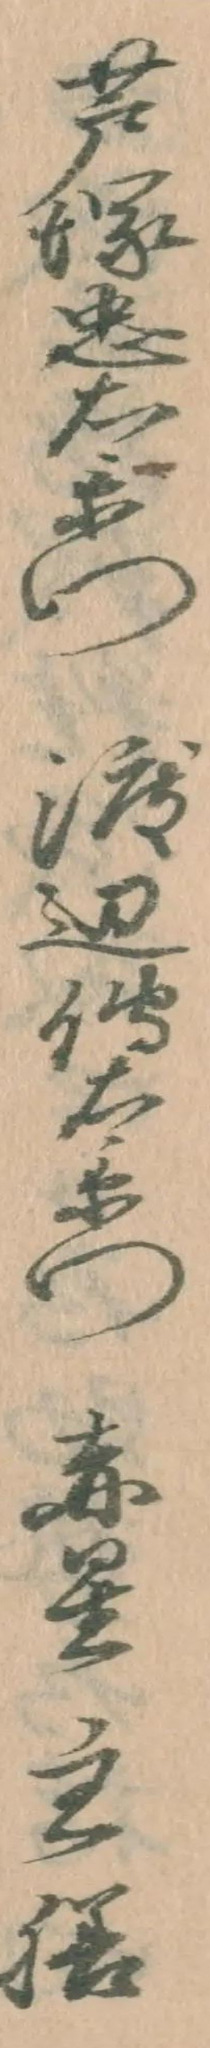芦塚忠右衛門渡辺伝右衛門赤星主膳
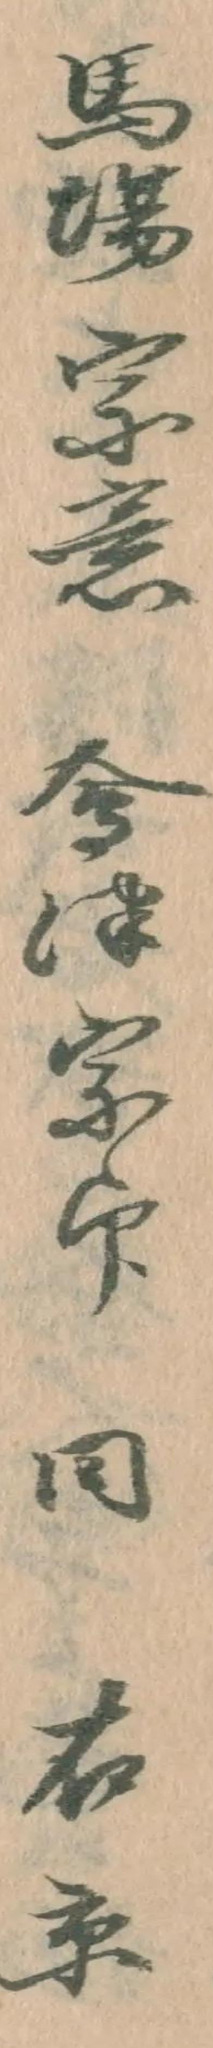馬場宗意会津宗印同右京
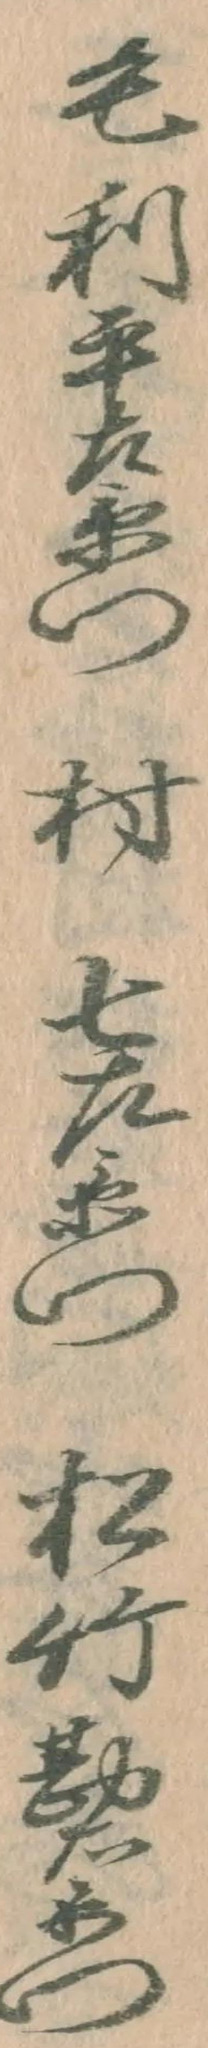毛利平左衛門村七左衛門松竹勘右衛門
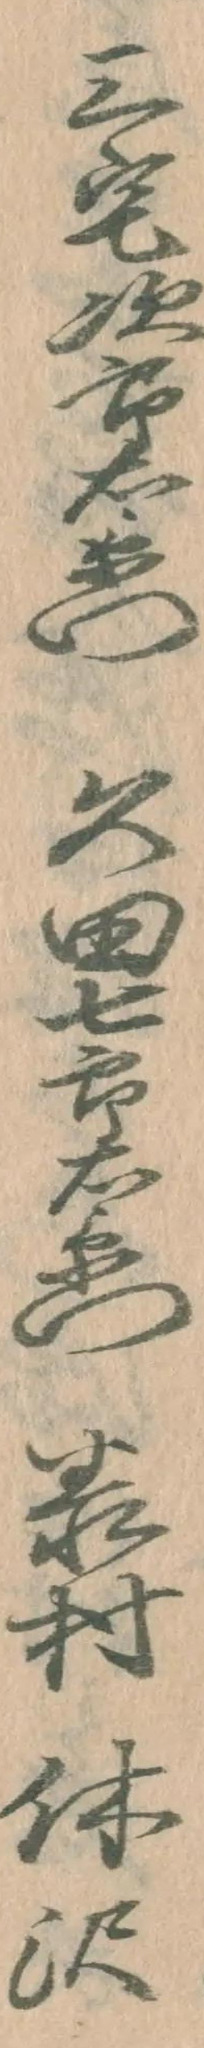三宅次市右衛門久田七郎右衛門承村休沢
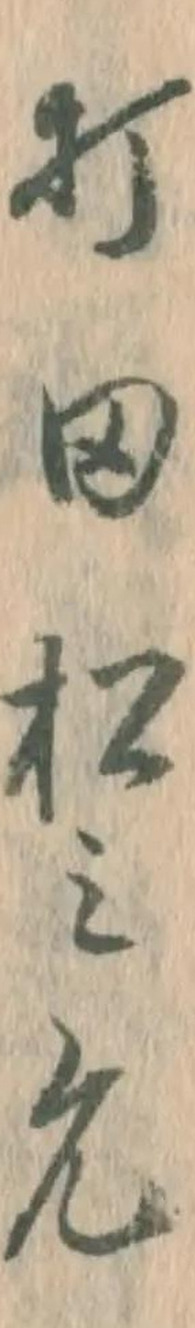打田松之允
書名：切支丹御退治記 49巻. [4]
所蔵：国立国会図書館 National Diet Library, JAPAN
